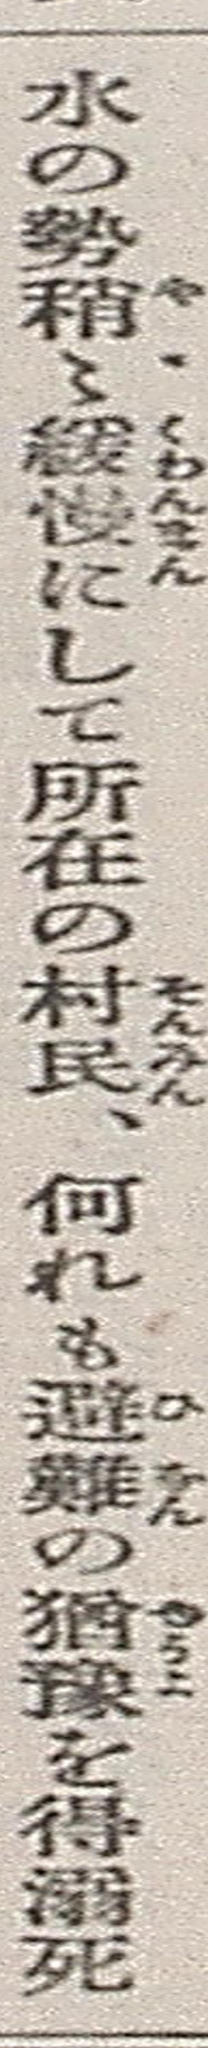水の勢稍々緩慢にして所在の村民、何れも避難の猶予を得溺死
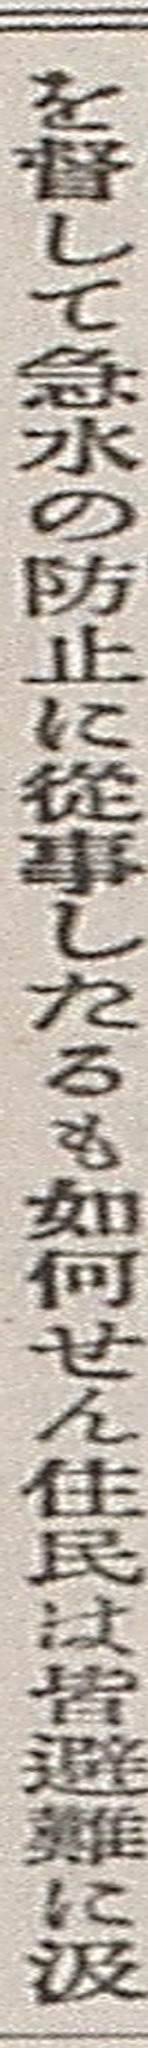を督して急水の防止に従事したるも如何せん住民は皆避難に汲
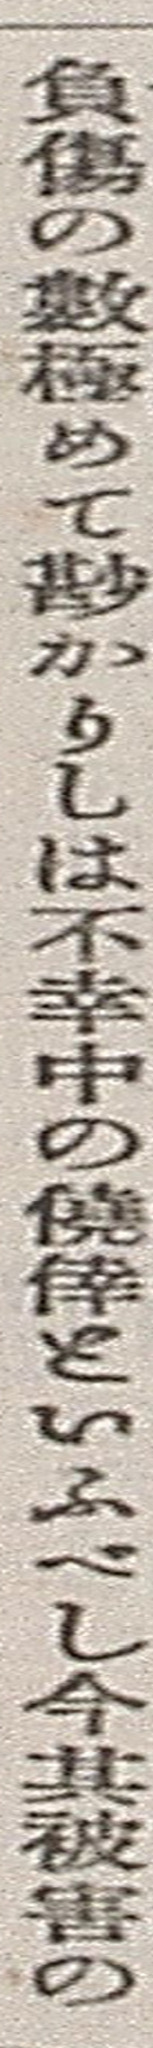負傷の数極めて少かりしは不幸中の僥倖といふべし今其被害の
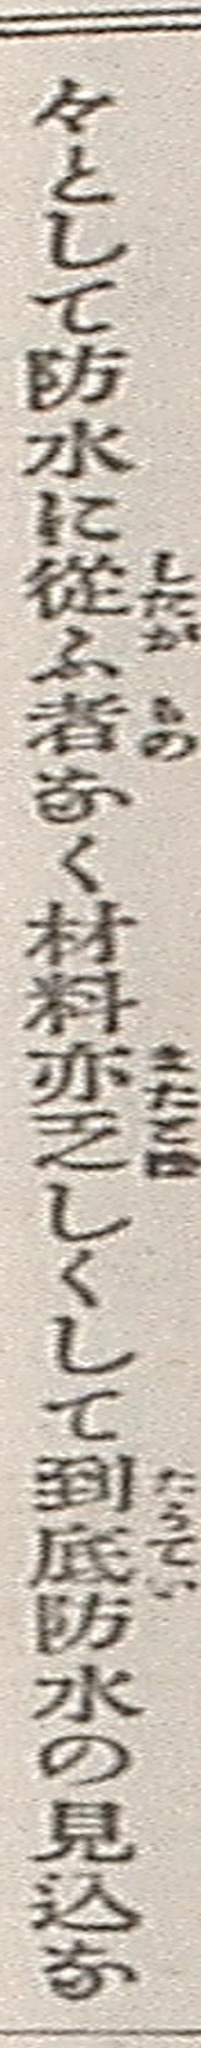々として防水に従ふ者なく材料亦乏しくして到底防水の見込な
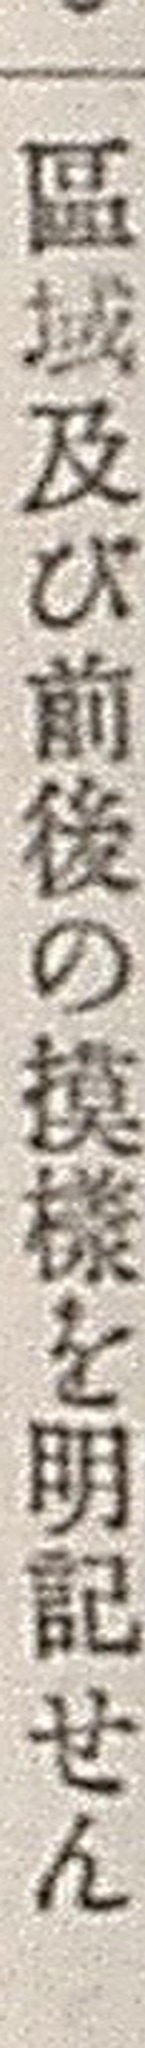区域及び前後の模様を明記せん
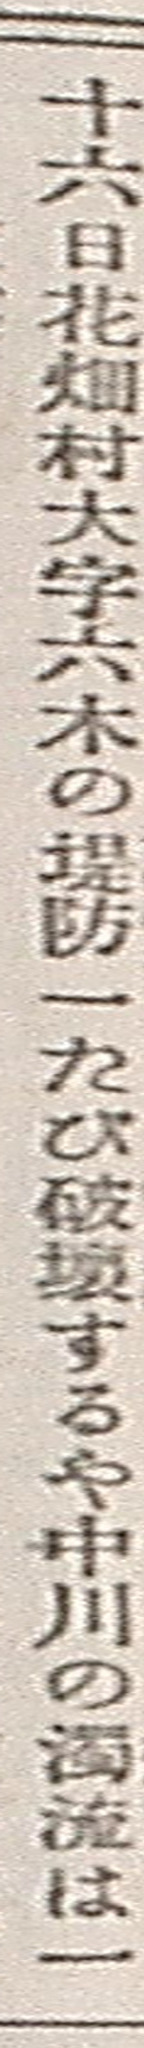十六日花畑村大字六木の堤防一たび破壊するや中川の濁流は一
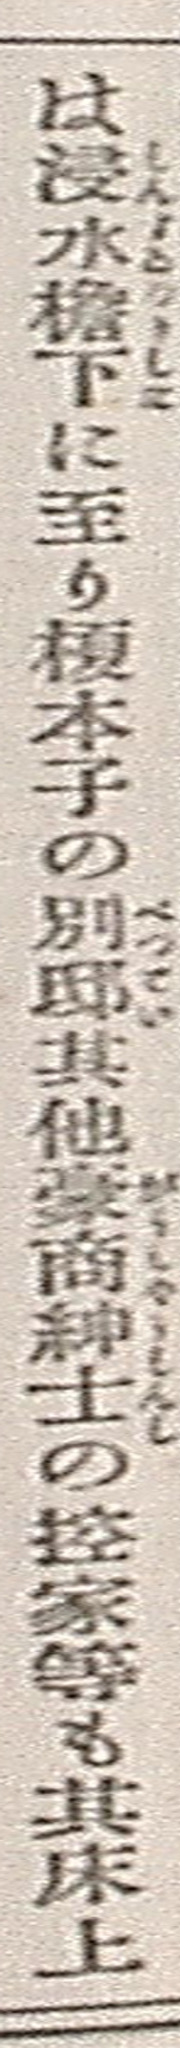は浸水檐下に至り榎本子の別邸其他豪商紳士の控家等も其床上
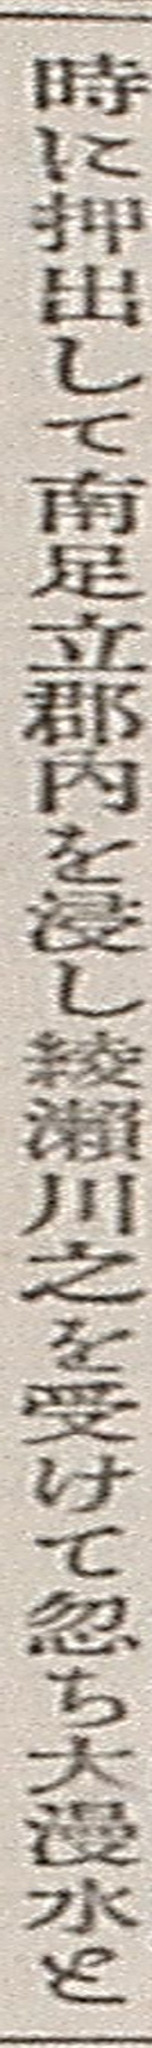時に押出して南足立郡内を浸し綾瀬川之を受けて忽ち大漫水と
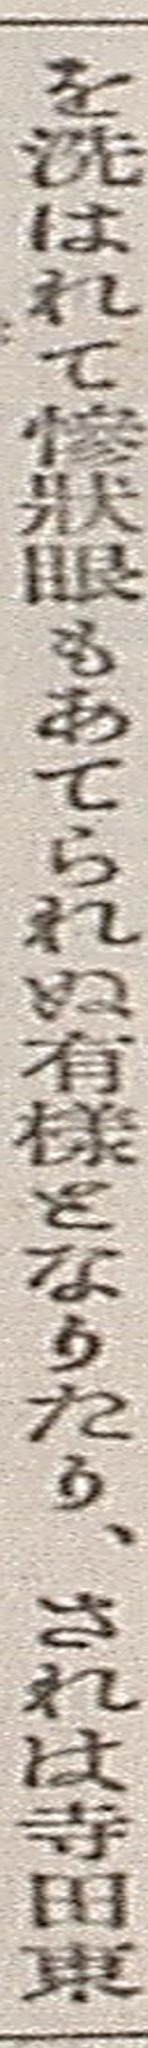を洗はれて惨状眼もあてられぬ有様となりたり、されは寺田東
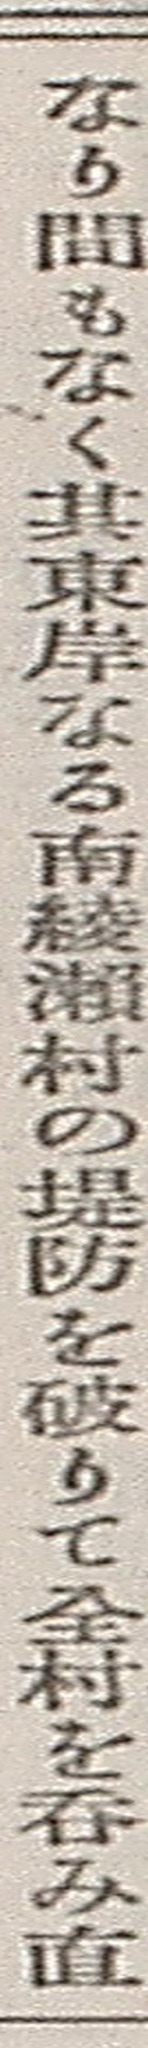なり間もなく其東岸なる南綾瀬村の堤防を破りて全村を呑み直
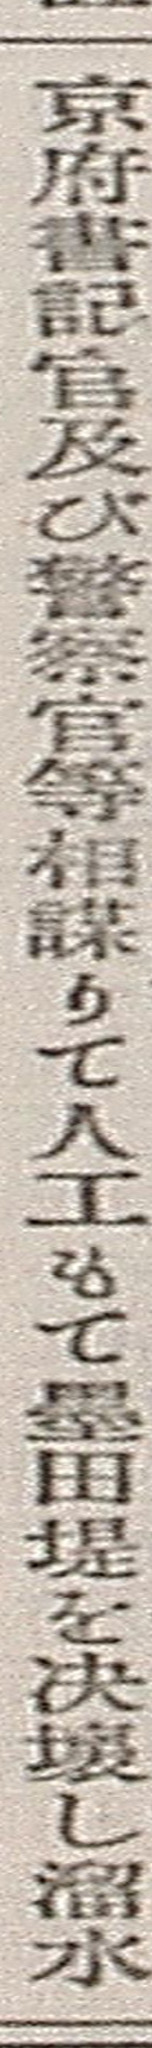京府書記官及び警察官等相謀りて人工もて隅田堤を決壊し溜水
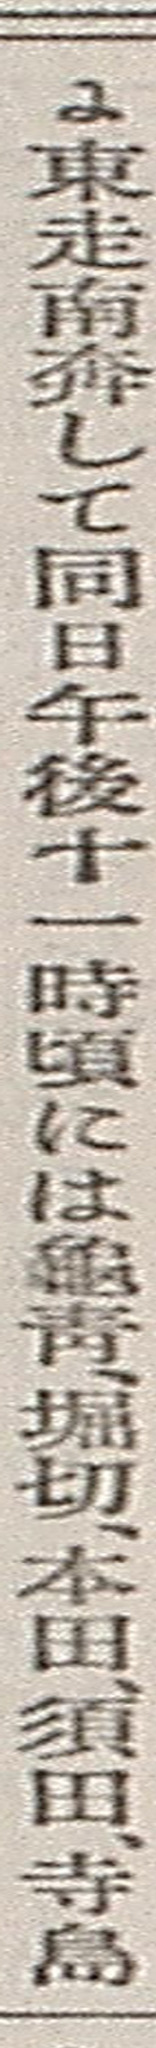に東走南奔して同日午後十一時頃には亀青、堀切、本田、須田、寺島
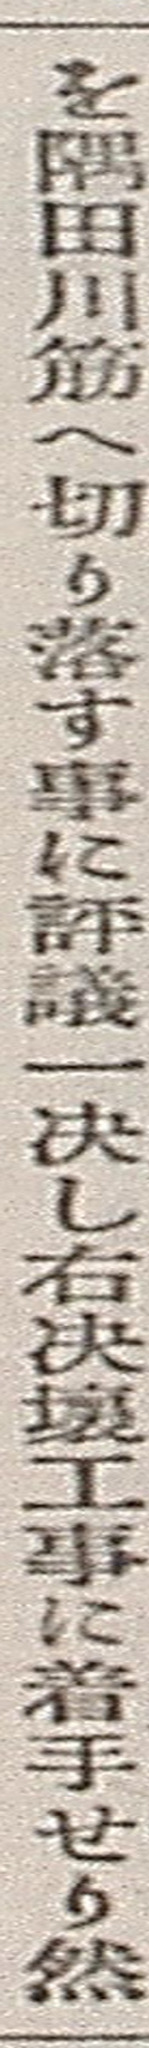を隅田川筋へ切り落す事に評議一決し右決壊工事に着手せり然
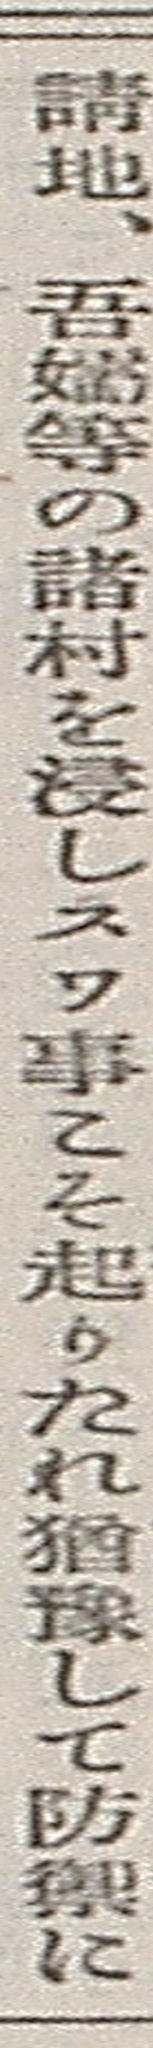請地、吾嬬等の諸村を浸しスワ事こそ起りたれ猶予して防禦に
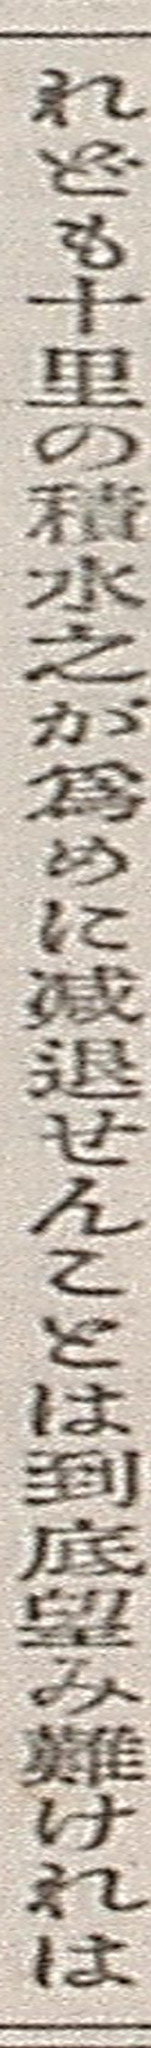れども十里の積水之が為めに減退せんことは到底望み難けれは
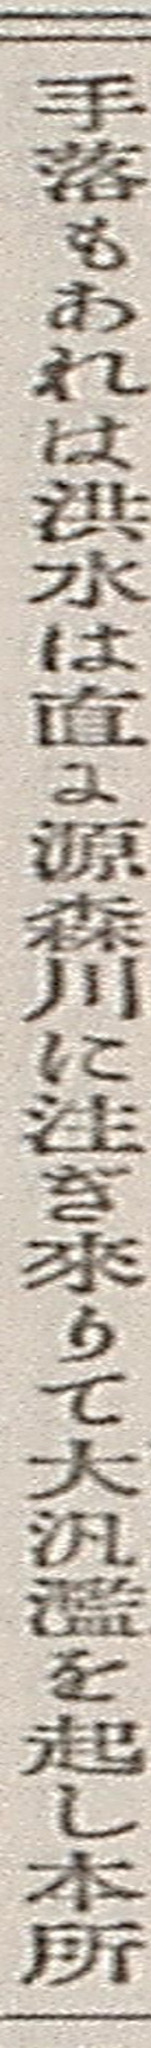手落もあれは洪水は直に源森川に注ぎ来りて大氾濫を起し本所
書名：風俗畫報臨時増刊第百二十四號　洪水地震被害録（上）
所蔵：東京大学地震研究所図書室 Earthquake Research Institute Library, The University of Tokyo, JAPAN
